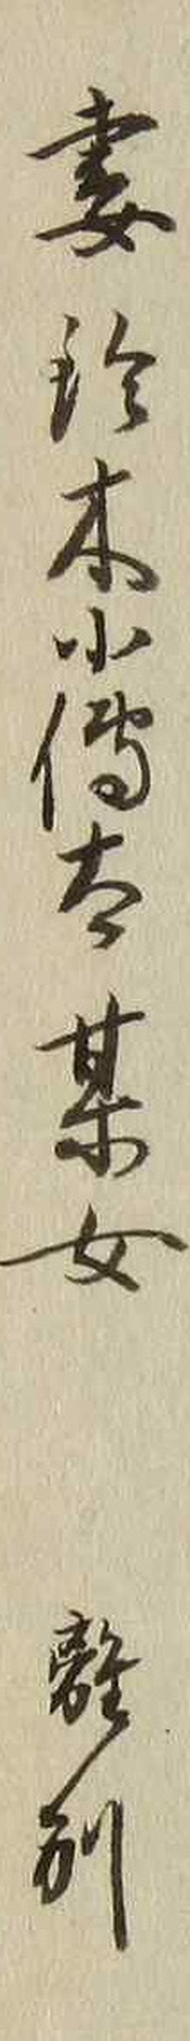妻鈴木小伝太某女離別
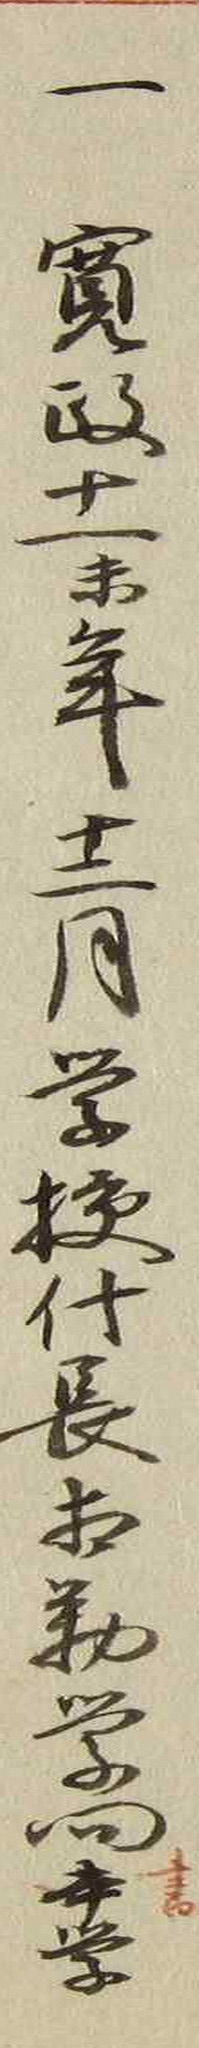一寛政十一未年十二月学校什長相勤学問書学
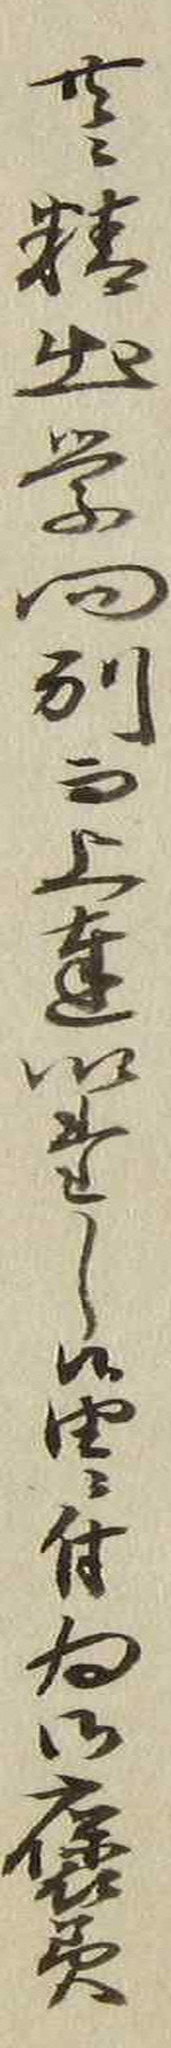共ニ精出学問別而上達いたし候由ニ付為御褒美
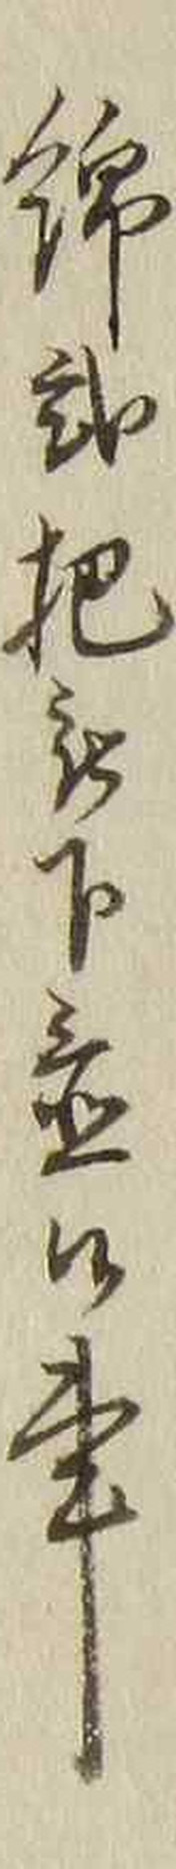綿弐把被下置候事
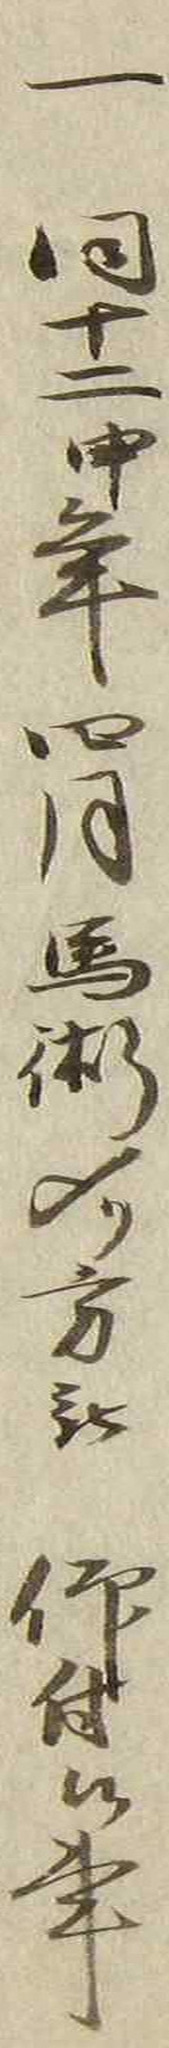一同十二申年四月馬術〆リ方被仰付候事
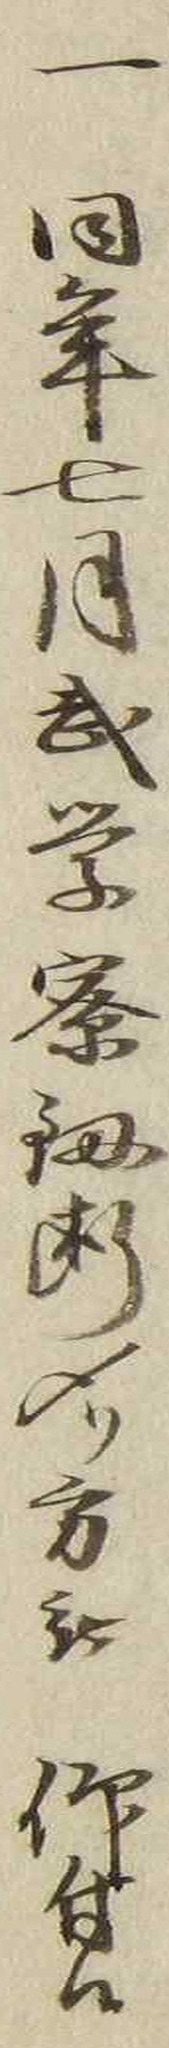一同年七月武学寮釼術〆リ方被仰付候

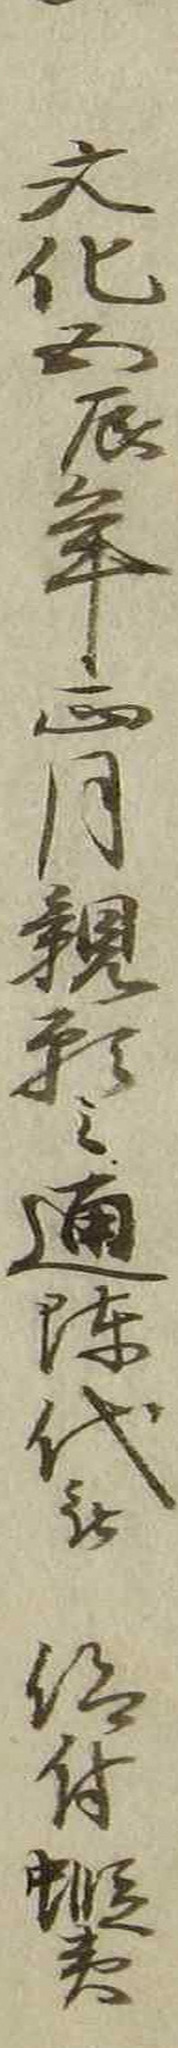一文化五辰年正月親願之通陳代被仰付蝦夷
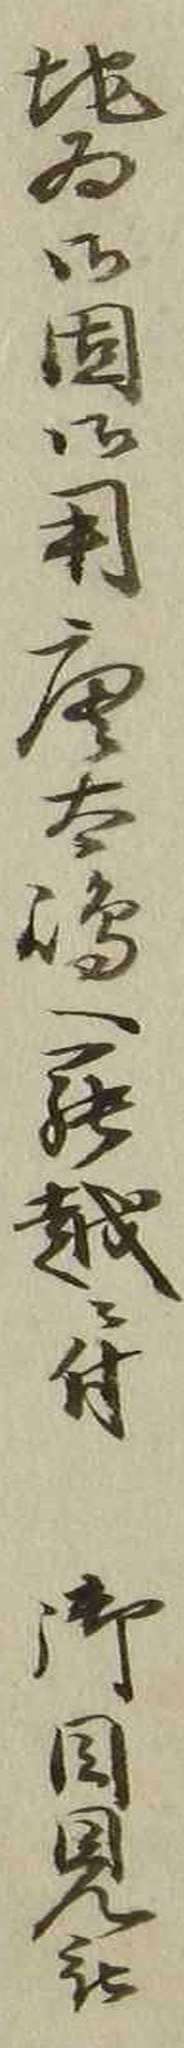地ゐ御固御用唐太島へ罷越ニ付御目見被
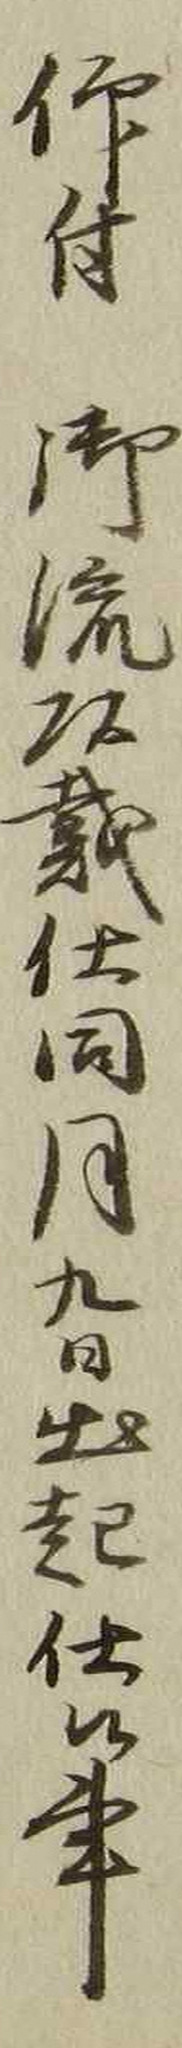仰付御流頂戴仕同月九日出起仕候事
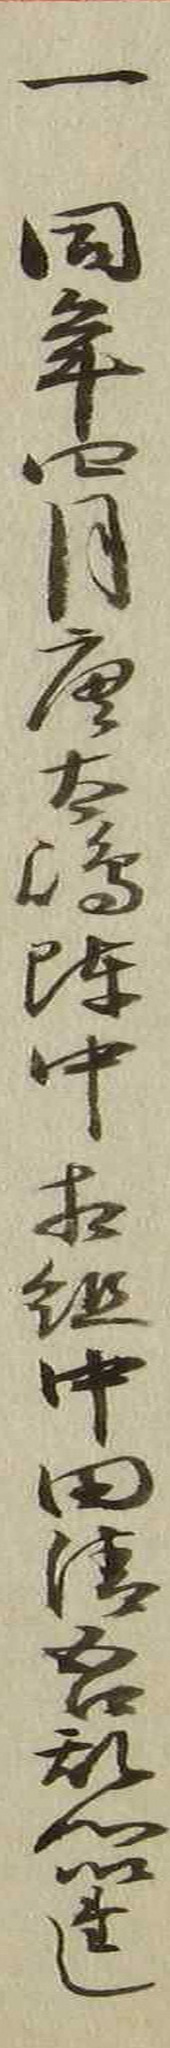一同年四月唐太島陳中相組中田清吾乱心いたし
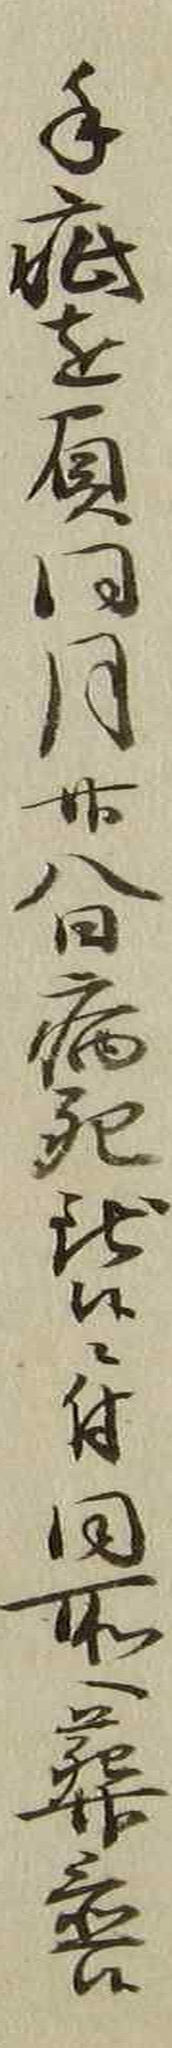手疵を負同月廿八日病死致候ニ付同所へ葬置候
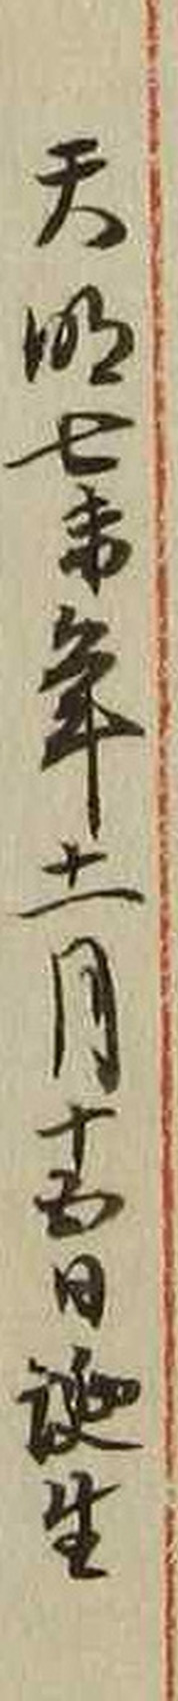天明七未年十一月十五日誕生
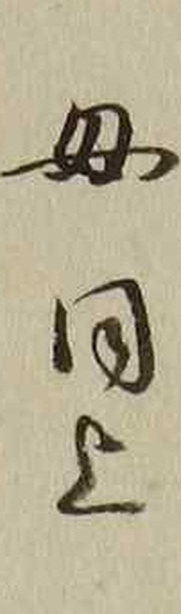母同上
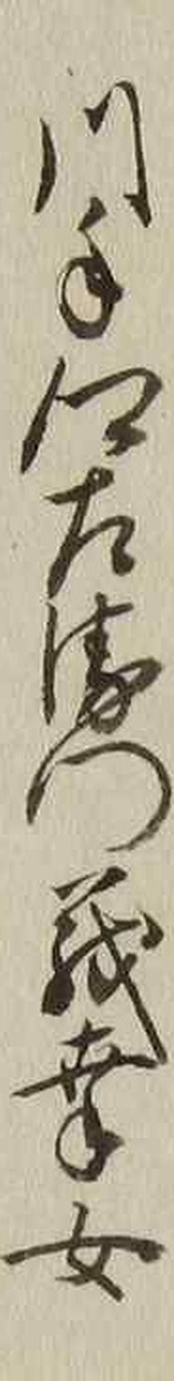川手郷左衛門義幸女同
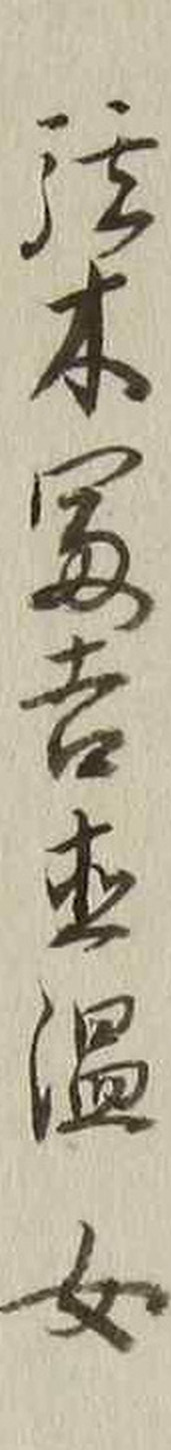弦木冨吉直温女
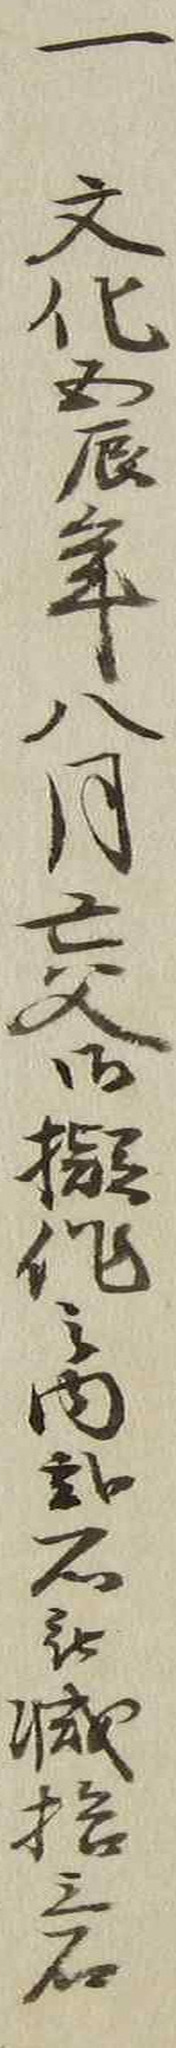一文化五辰年八月亡父御擬作之内弐石被減拾三石
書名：諸士系譜　巻之114　か之部22
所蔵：会津若松市立会津図書館
